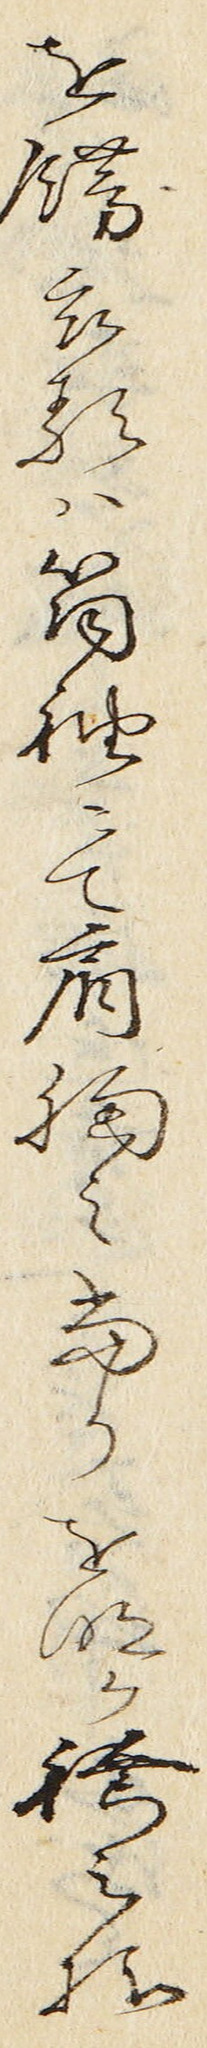を錺衣類は筒袖にて肩胸之当りを明け袴之様
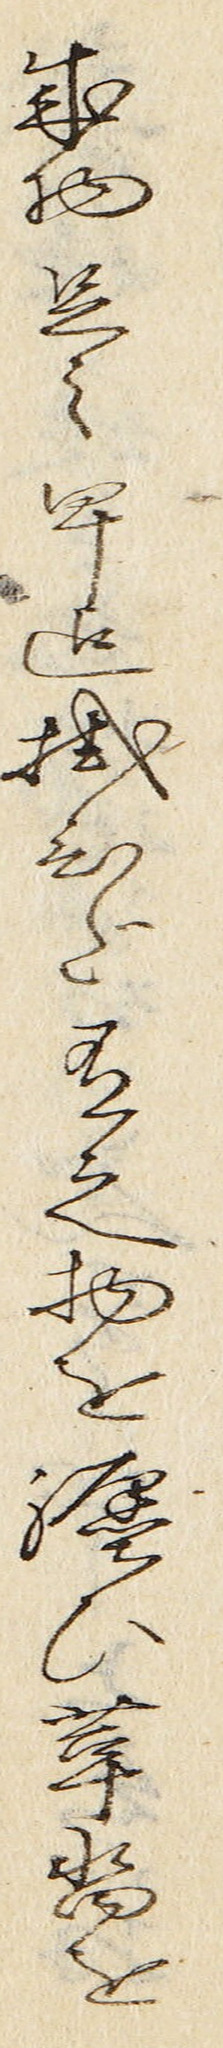成物足之甲迄掛ひだ有之物を纏ひ革沓を
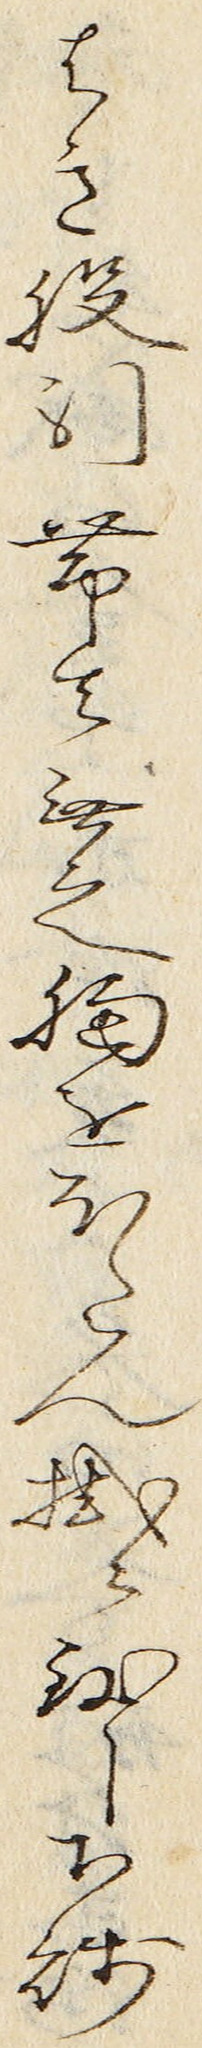はき股引帯は無之胸をほたん掛に致し下賤
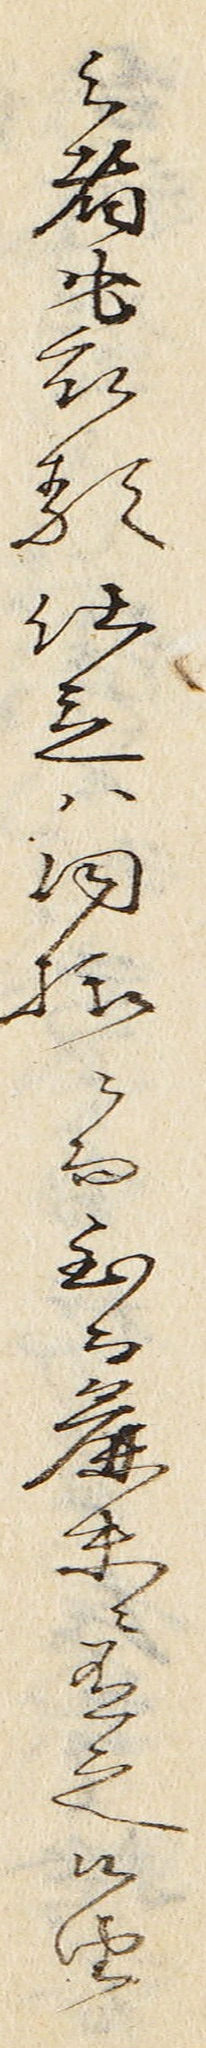之者も衣類仕立は同様に而至而麁末に有之候由
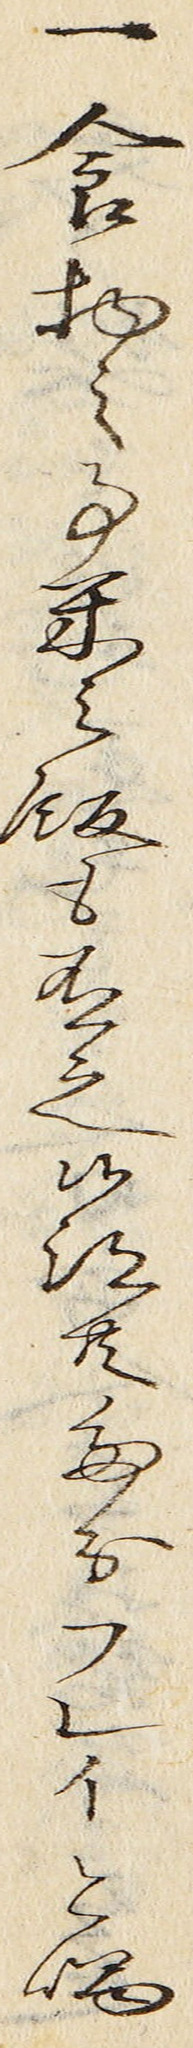一食物之事米之飯も有之候得共多分フレイと唱
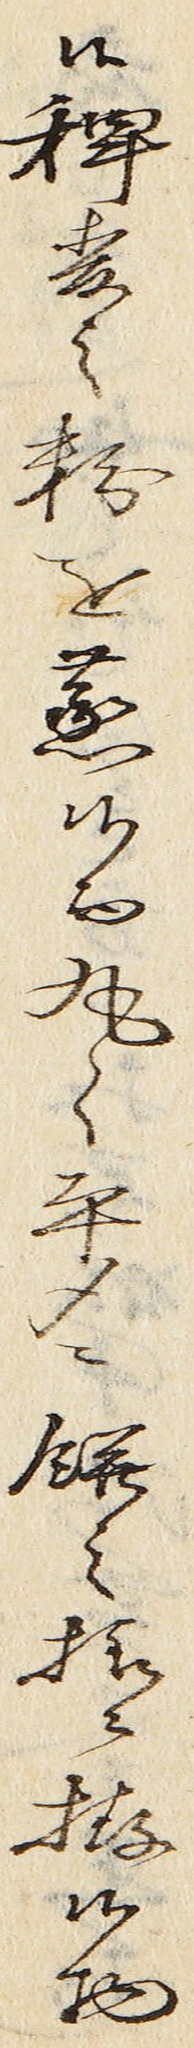候稗麦之粉を蒸候而丸く平めに餅之様に拵候物
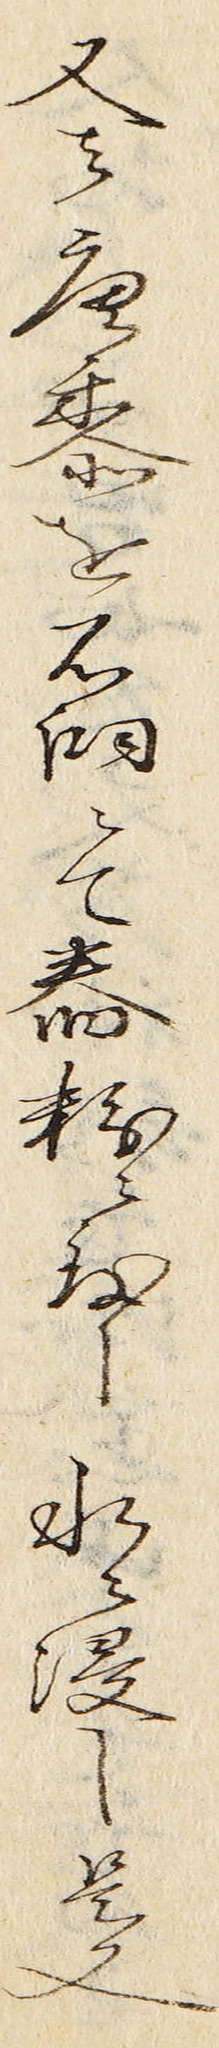又は唐黍を石臼にて𣇃粉に致し水に浸し是又

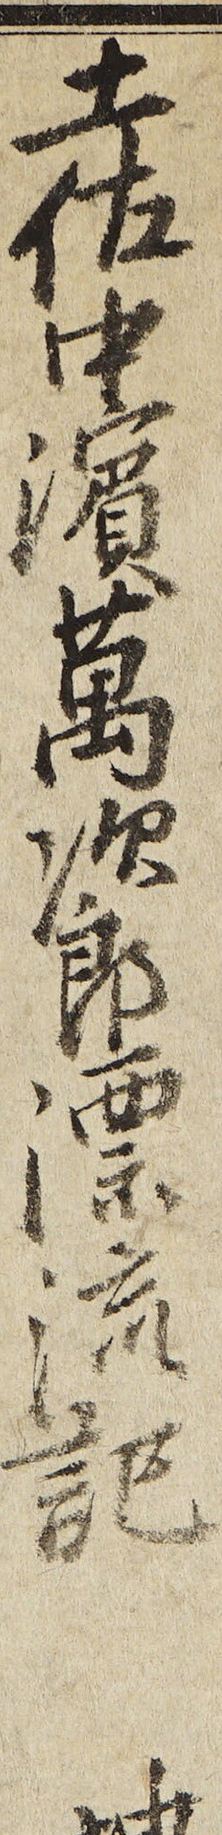土佐中浜万次郎漂流記坤

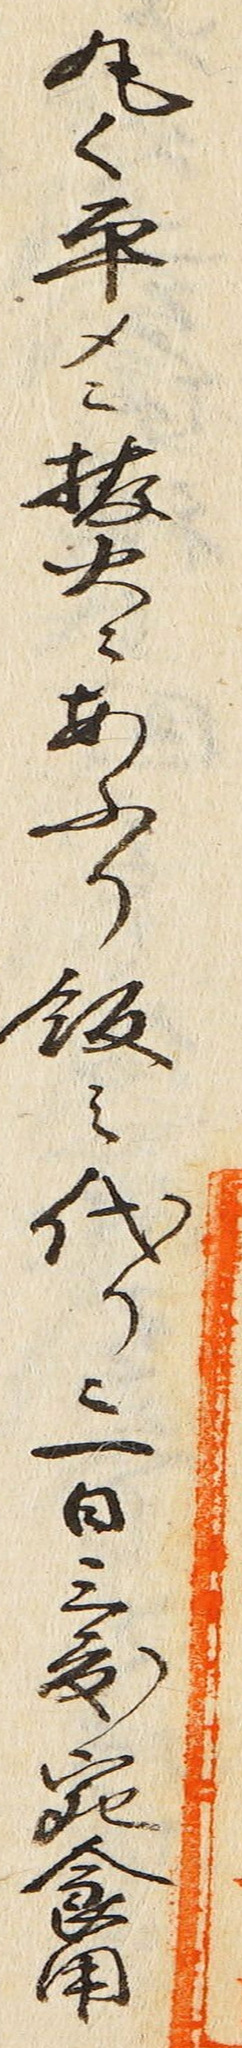丸く平めに拵火にあふり飯之代りに一日三度宛食用
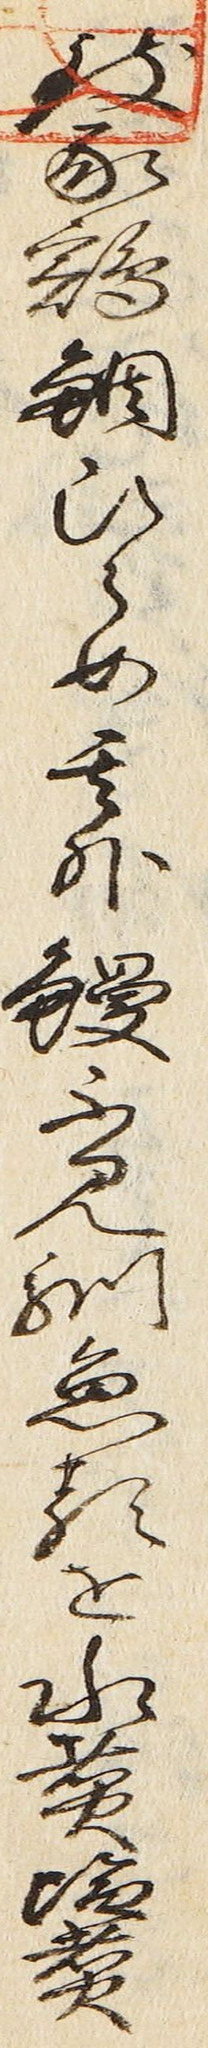致豕鶏鯛ひらめ其外鰻不見馴魚類を水煮塩煮
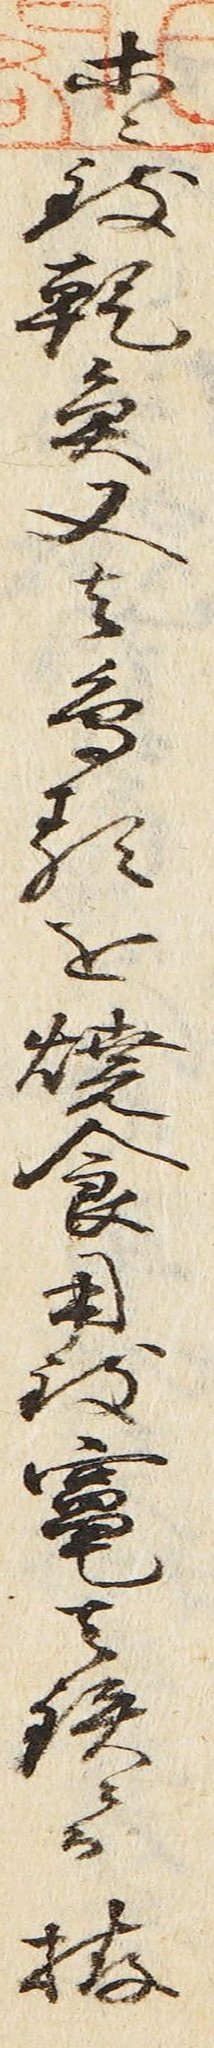等に乾魚又は鳥類を焼食用致竃は鉄にて拵
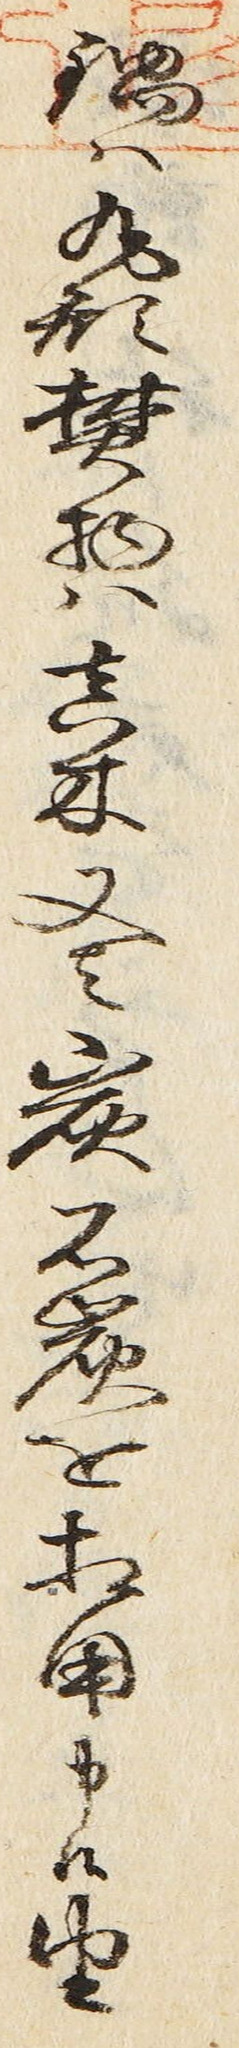鍋は丸形焚物は真木又は炭石炭を相用申候由
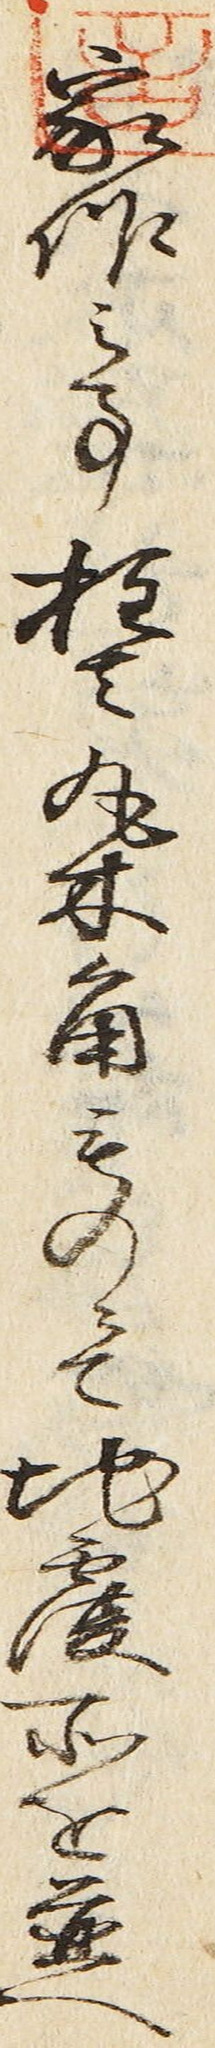一家作之事柱は丸木角ものにて地覆所を並へ
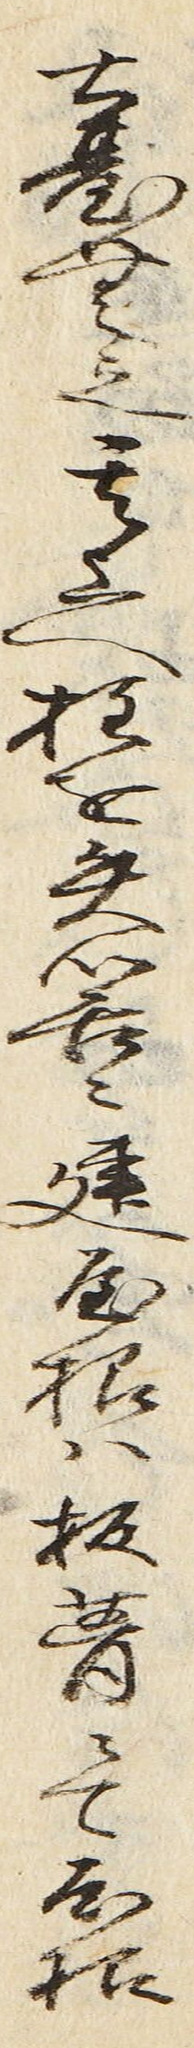土台無之其上へ柱を矢筈に建屋根は板葺にて屋根
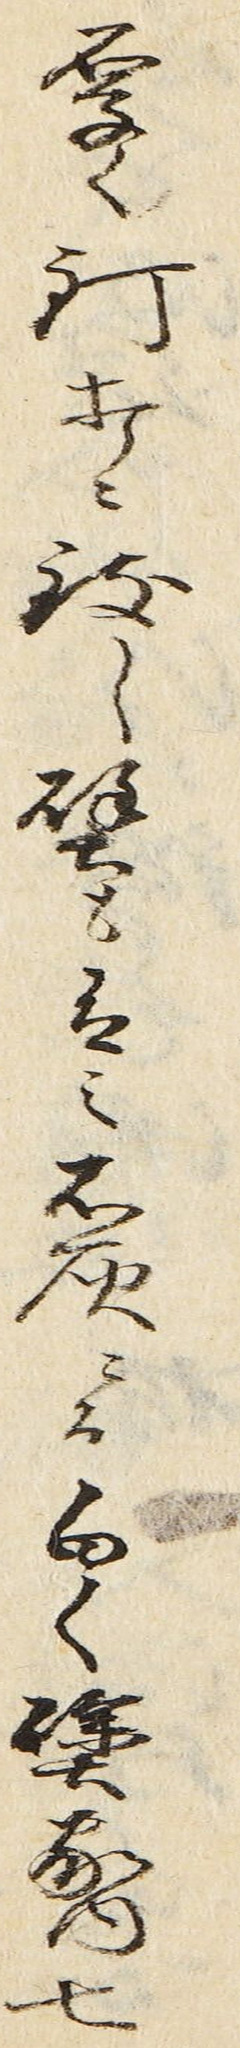厚く釘打に致し壁も有之石灰に而白く塗り家内七
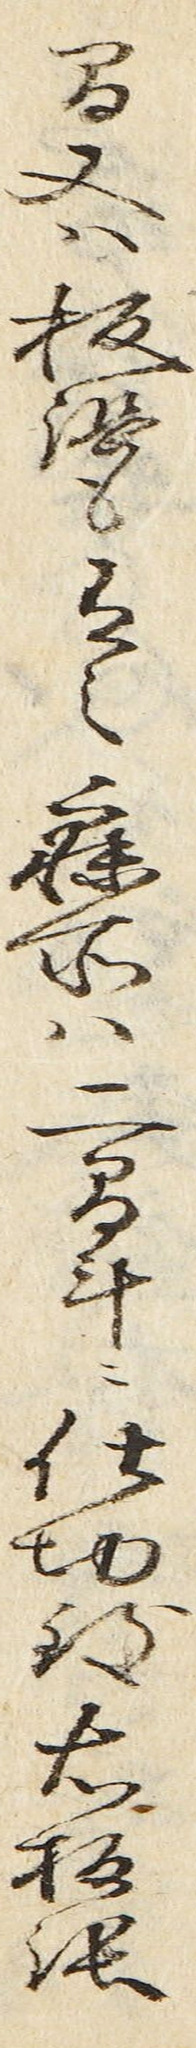間又は板張も有之寝所は二間計に仕切致右板張
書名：土佐中浜万次郎漂流記
